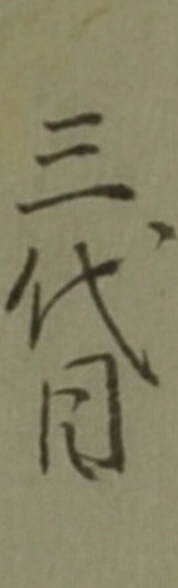三代目
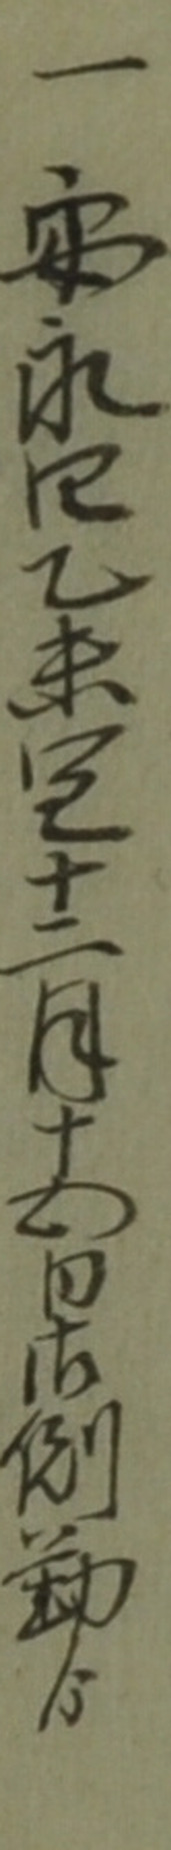一安永四乙巳閏十二月十五日御側勤ゟ
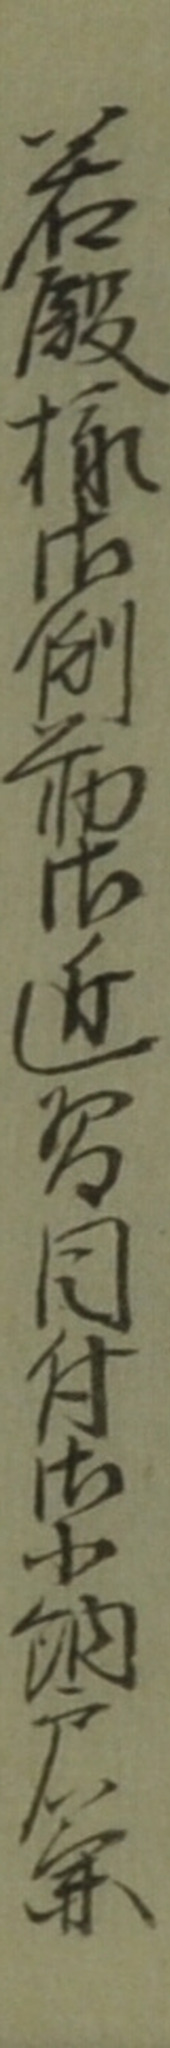若殿様御側御近習目付御小納戸兼
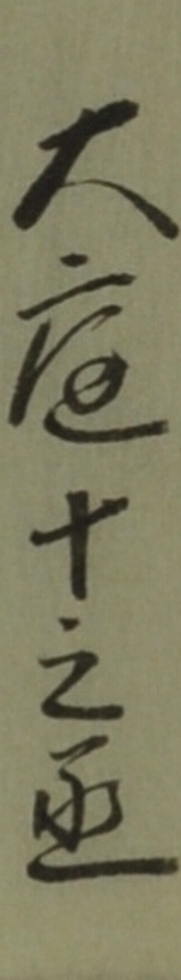大庭十之丞
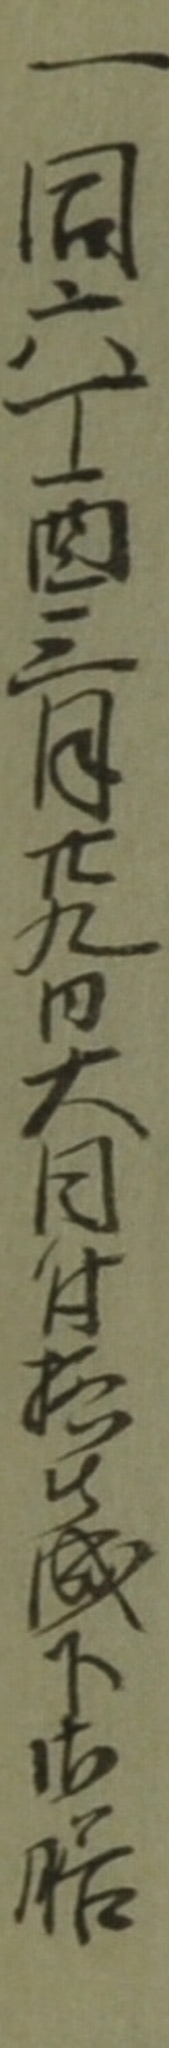一同六丁酉三月廿九日大目付格被成下御膳
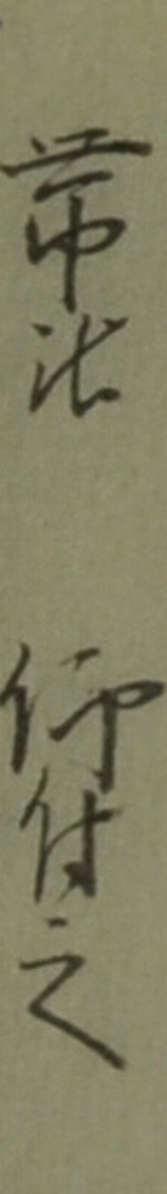帯被仰付之
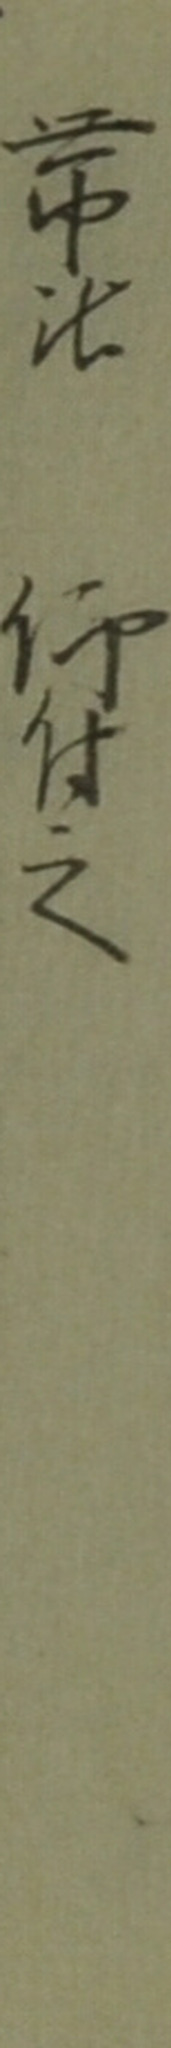帯被仰付之
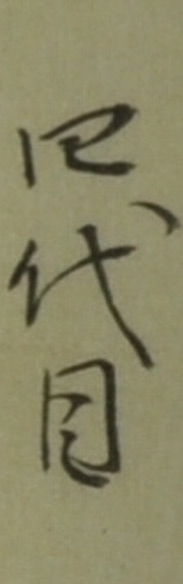四代目

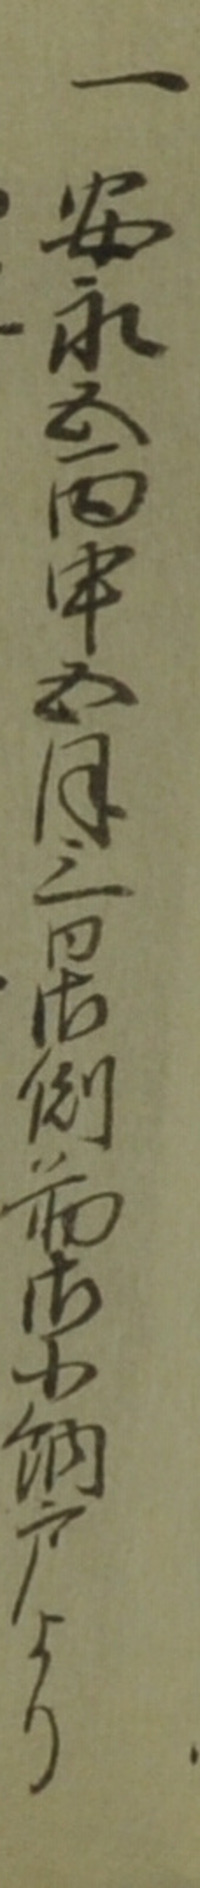一安永五丙申五月三日御側勤御小納戸より
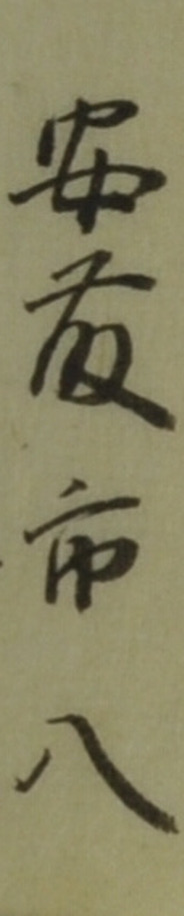安藤市八
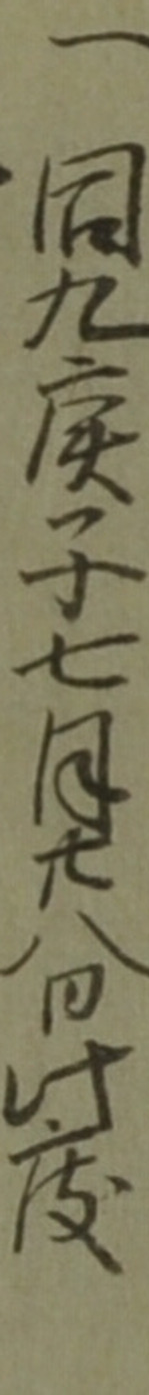一同九庚子七月廿八日此度
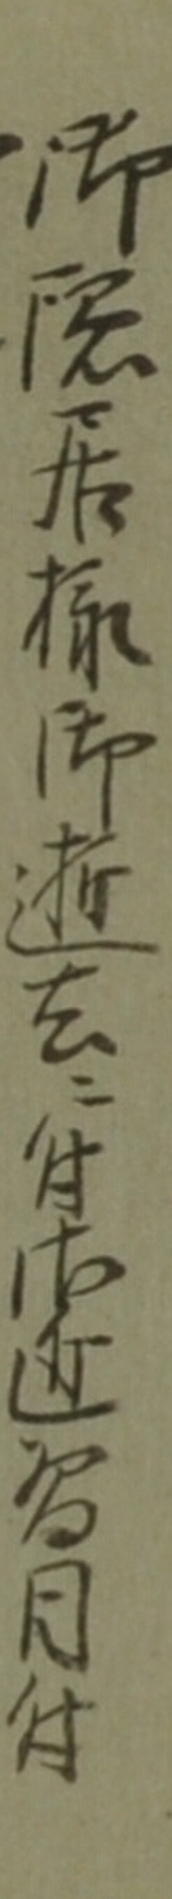御隠居様御逝去ニ付御近習目付
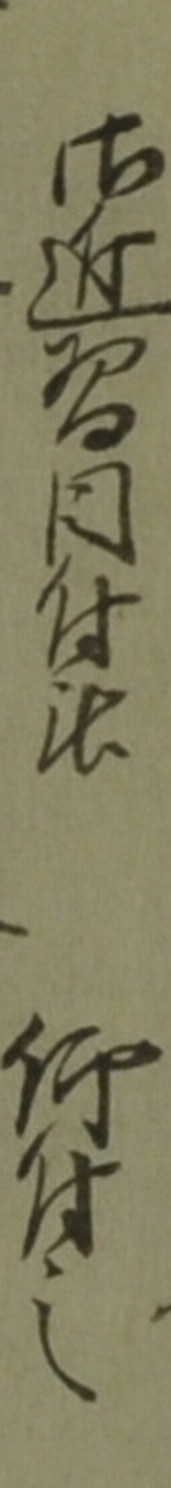御近習目付被仰付之
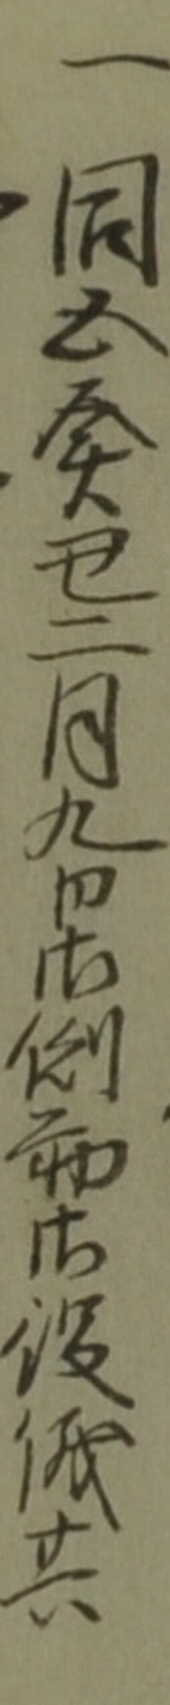一同五癸丑二月九日御側勤御役儀共
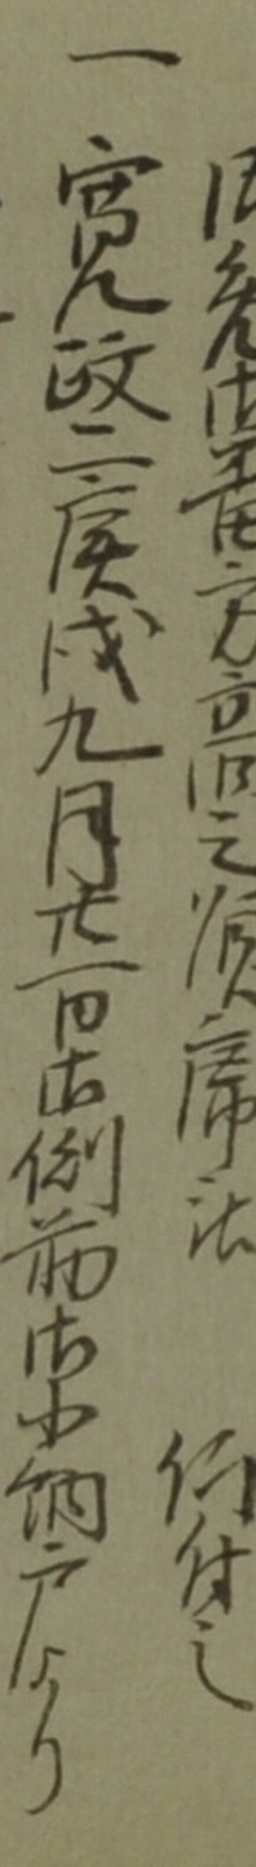一寛政二庚戌九月廿一日御側勤御小納戸より
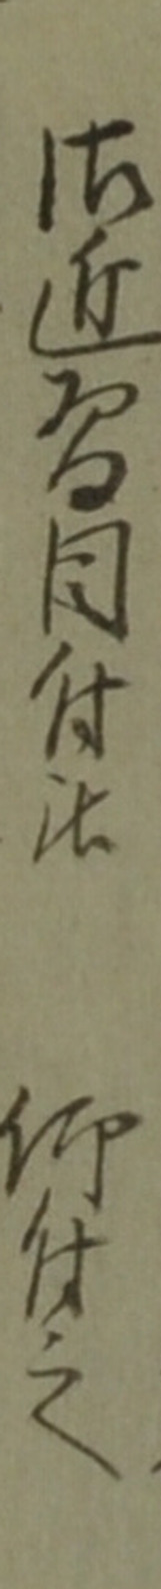御近習目付被仰付之
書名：諸御役代々録（四）
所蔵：伊那市立高遠町図書館・合同会社AMANE
